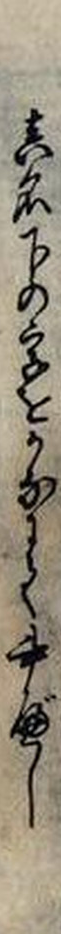真名下の字をかなにて書べし

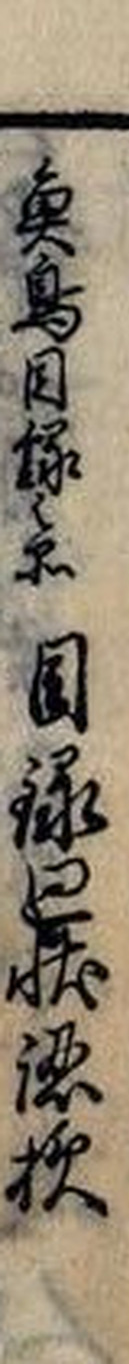魚鳥目録之品目録廻状認様
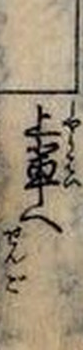上輩へ
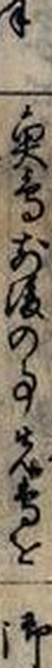魚鳥前後の事先鳥を
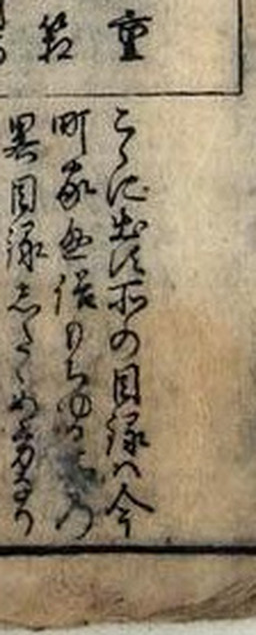こゝに出す所の目録は今
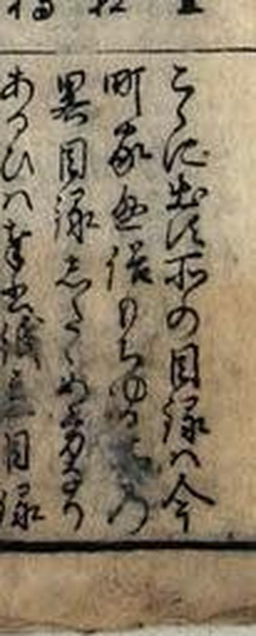町家通俗もちゆる所の
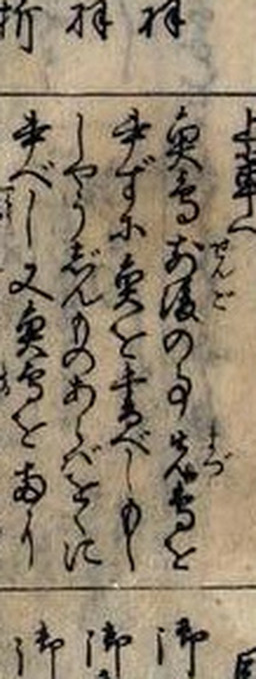書ずに魚を書べしもし
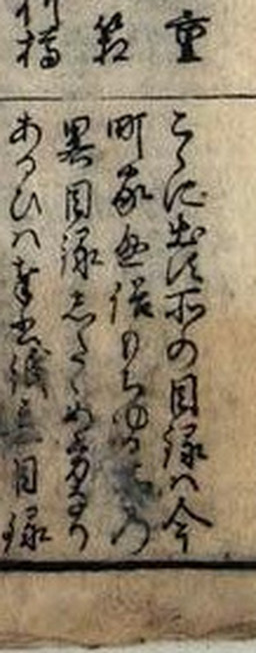町家通俗もちゆる所の
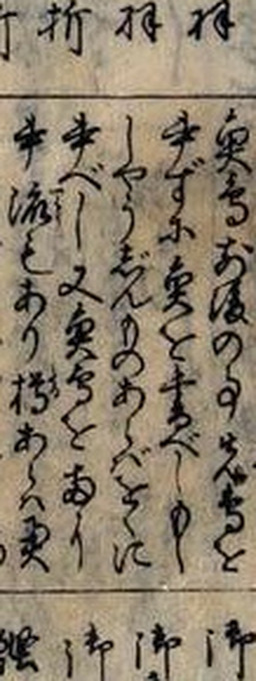しやうじんものあらばをくに
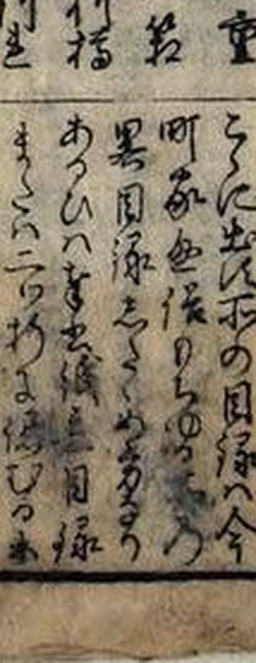略目録志たゝめ方なり
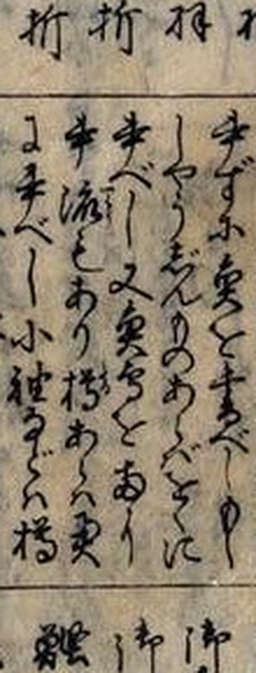書べし又魚鳥を両に
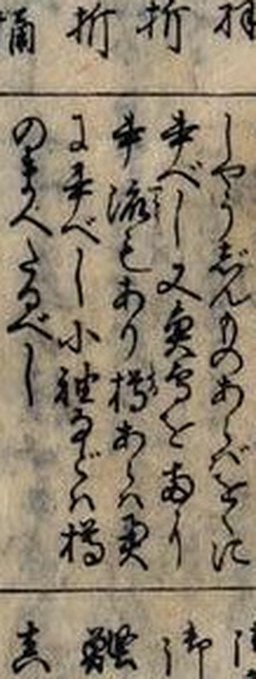書流もあり樽あらは奥
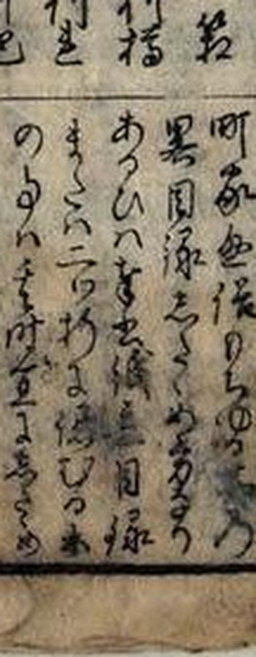あるひは奉書紙立目録
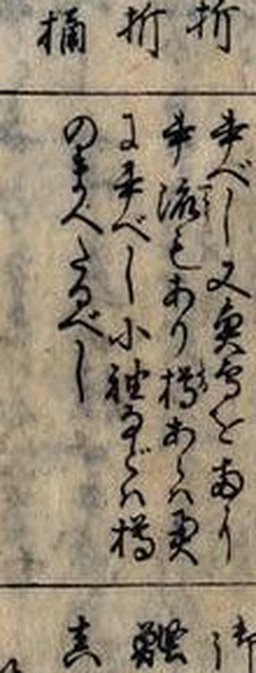に書べし小袖などは樽
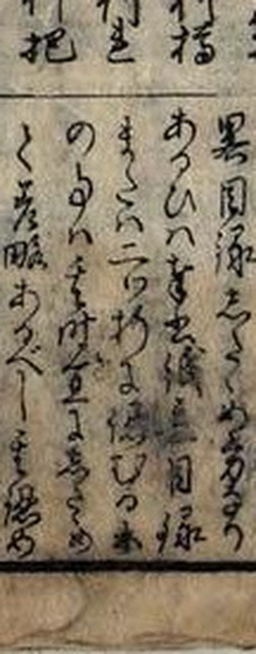または二ッ折に認むる等
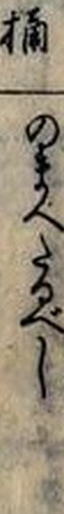のまへたるべし
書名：大成用文章（往来物）
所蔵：福井県文書館 Fukui Prefectural Archives
